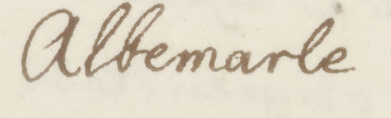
Albemarle
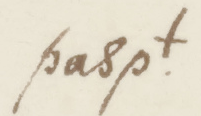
paspt
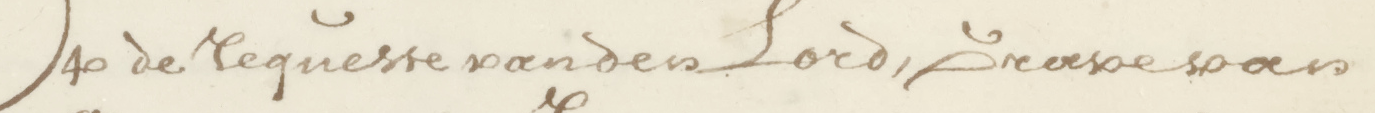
Op de requeste vanden Lord, Grave van
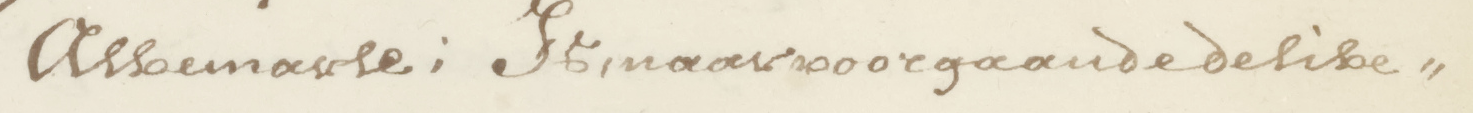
Albemarle; Is naar voorgaande delibe„
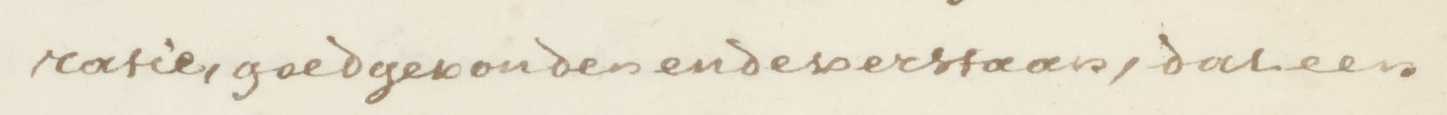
ratie, goedgevonden en verstaan, dat een
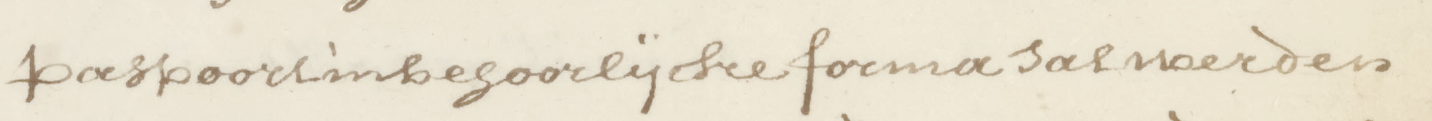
paspoort in behoorlijcke forma sal werden
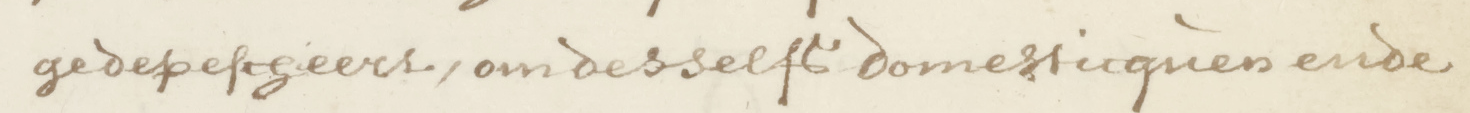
gedepescheert om desselfs domesticquen ende
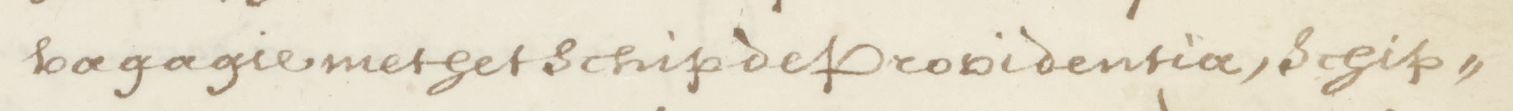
bagagie met het schip de Providentia, schip„
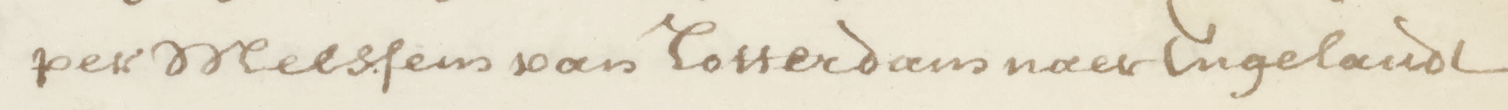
per Melssem van Rotterdam naar Engelandt
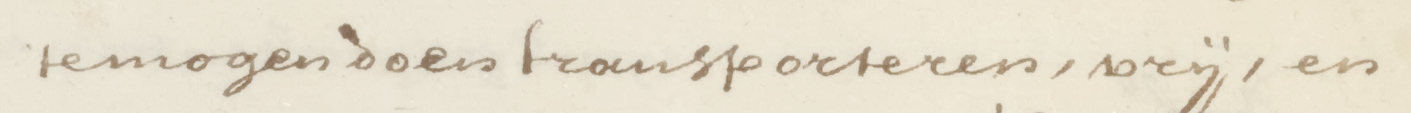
te mogen doen transporteren, vrij en
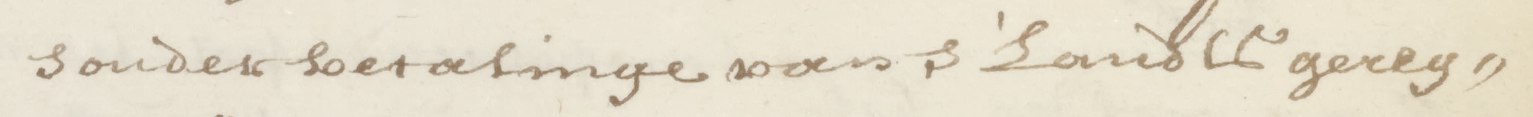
sonder betalinge, van s'Landts gereg„
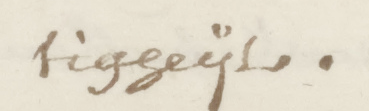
tigheijt.
